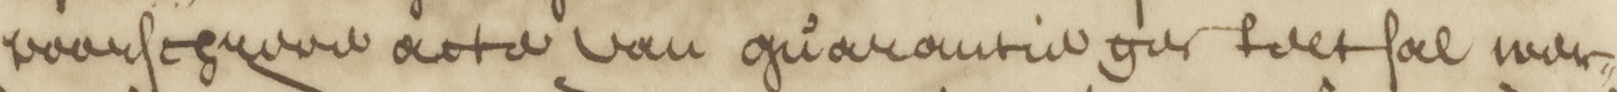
voorschreve acte van guarantie gestelt sal wer„
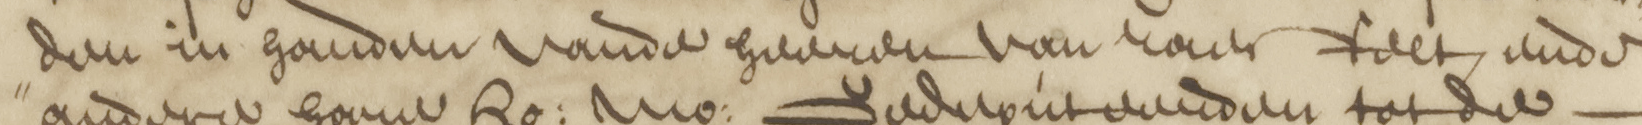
„den in handen vande heeren van raesfelt, ende
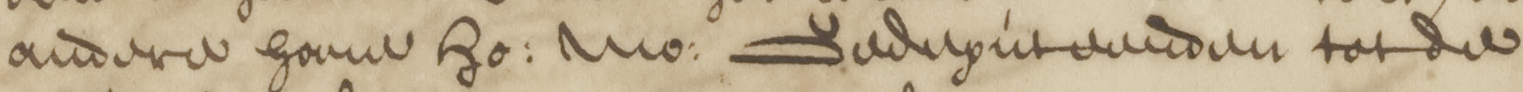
andere hare Ho:Mo: Gedeputeerden tot de
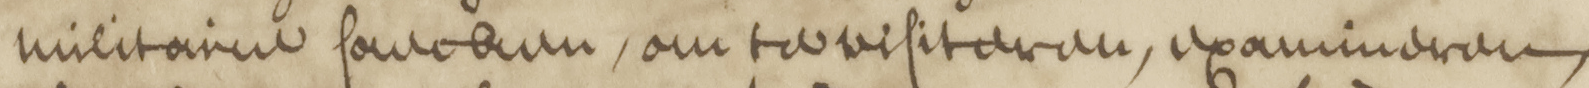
militaire saecken, om te visiteren, examineren
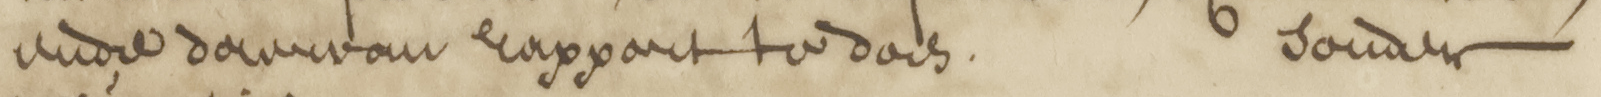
ende daervan rapport te doen. sonder
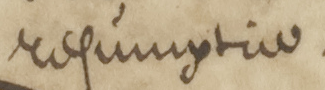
resumptie.
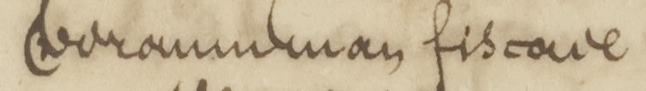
veranneman fiscael
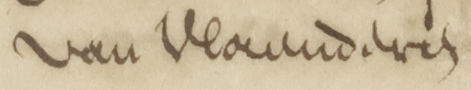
van Vlaenderen
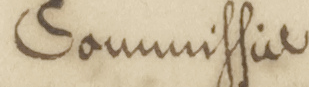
Commissie
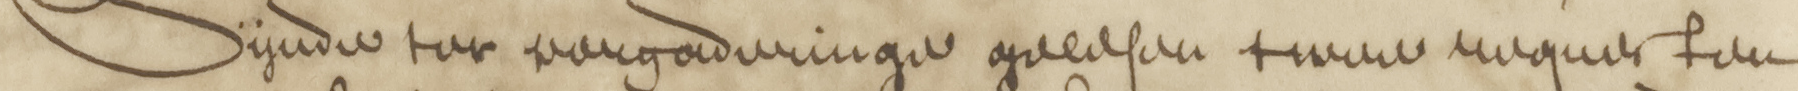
Sijnde ter vergaderinge gelesen twee requesten
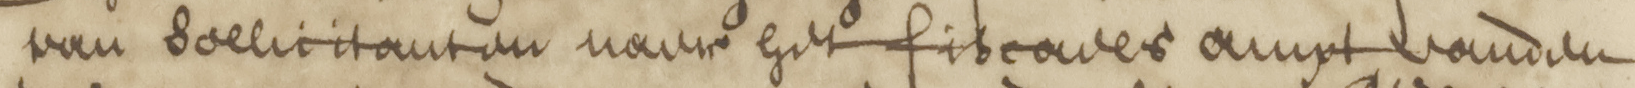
van sollicitanten naer het fiscaels Ampt vanden
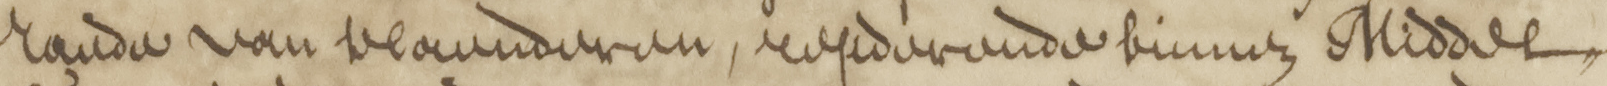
raede van vlaenderen, residerende binnen Middel„
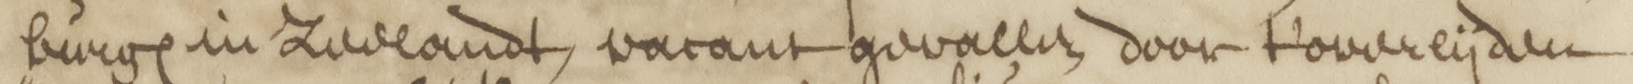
„burgh in Zeelandt, vacant gevallen door t'overlijden
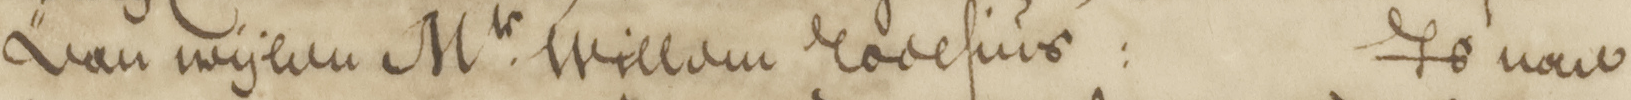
van wijlen Mr. Willem Roelsius: Is nae
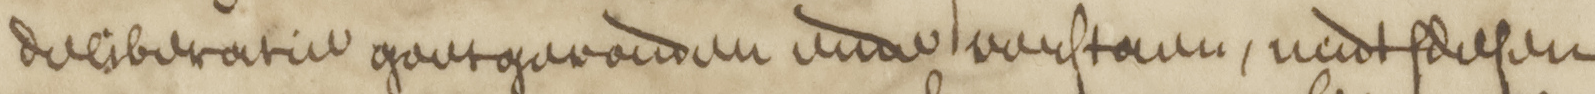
deliberatie goetgevonden ende verstaen, midtsdesen
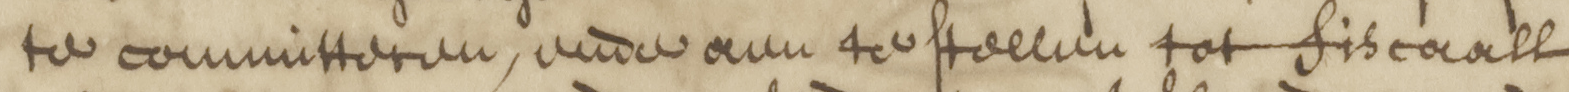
te committeren, ende aen te stellen tot fiscaall
